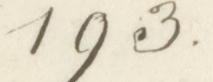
193
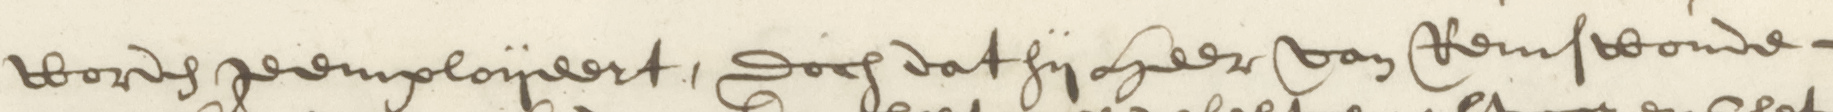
worden geemploijeert, doch dat hij heer van Reinswoude
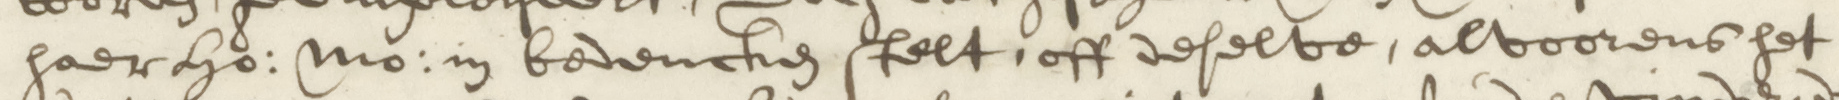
haer Ho:Mo: in bedencken stelt, off deselve alvoorens het
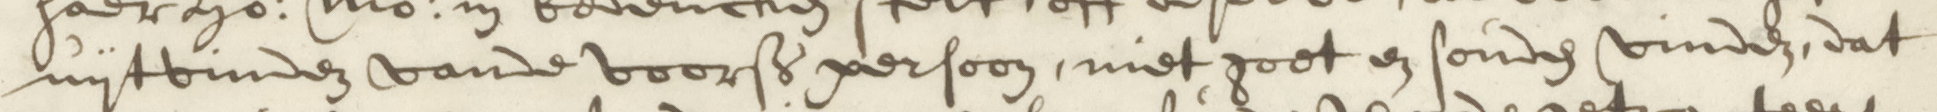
uijtvinden vande voors persoon, niet goet en souden vinden, dat
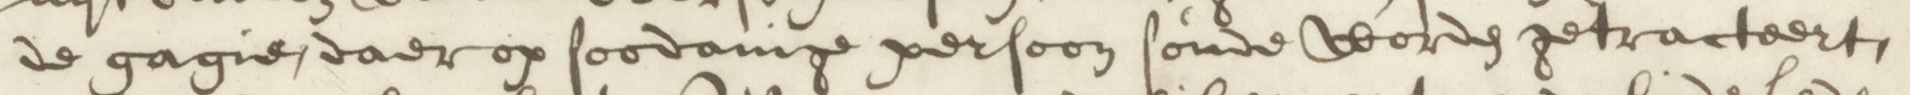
de gagie daer op soodanige persoon soude worden getracteert,
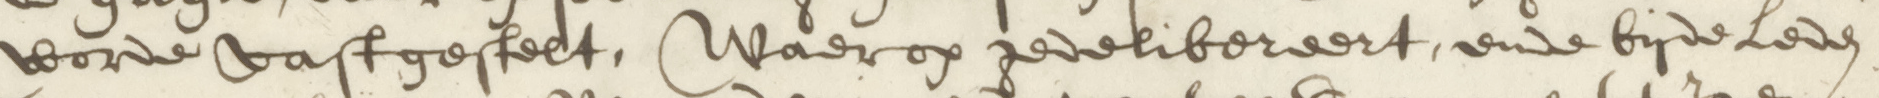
worde vastgestelt. Warop gedelibereert ende bijde Leden
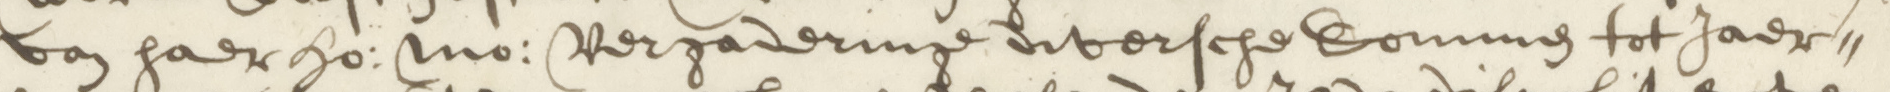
van haer Ho:Mo: vergaderinge diversche sommen tot jaer„
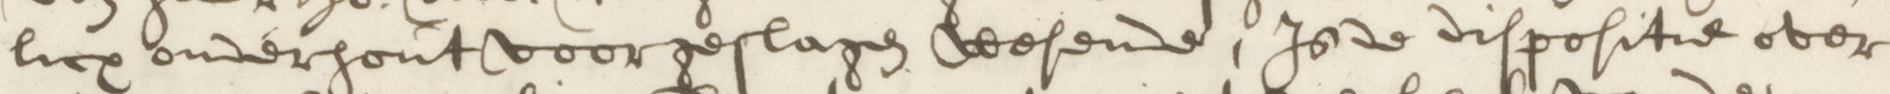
licx onderhout voorgeslagen wesende, is de dispositie over
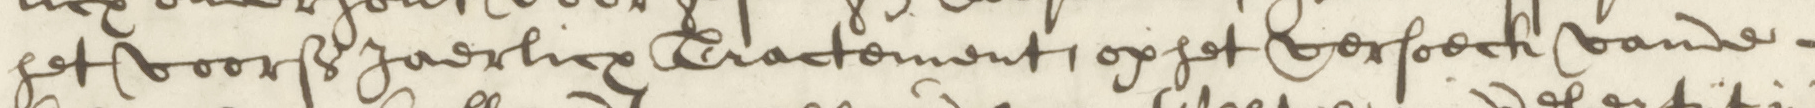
het voors jaerlicx Tractement, ophet versoeck vande
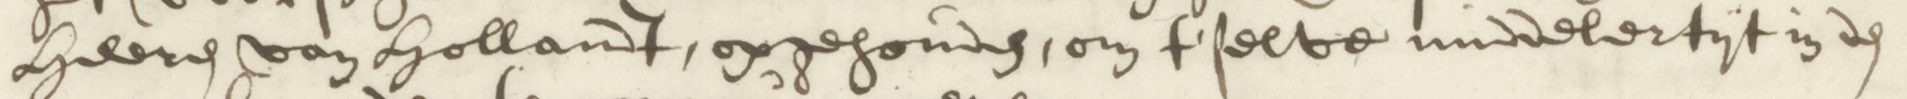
heeren van Hollandt, opgehouden om tselve middelertijt in de
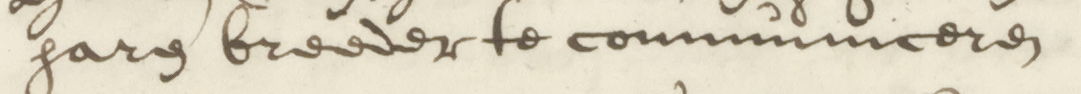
haren breeder te communiceren.
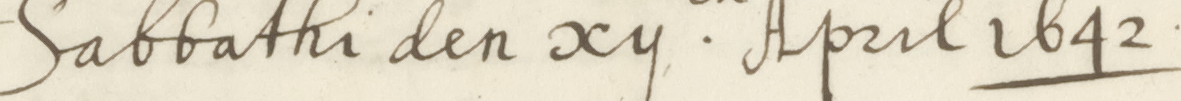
Sabbathi den xijen April 1642
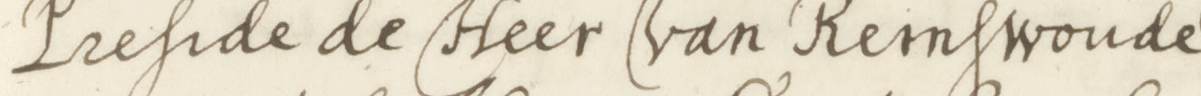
Preside de Heer van Reinswoude,
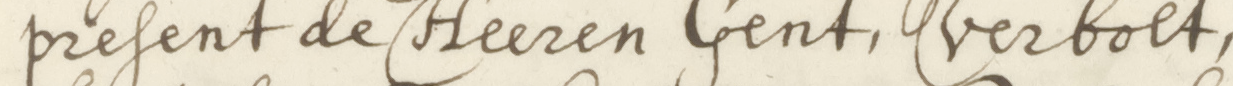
present de Heeren Gent, Verbolt,
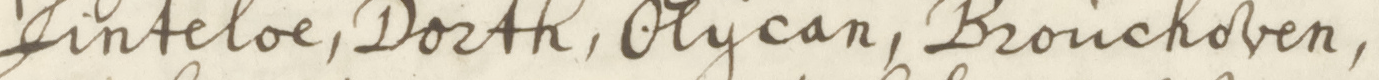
Linteloe, Dorth, Olijcan, Brouchoven,
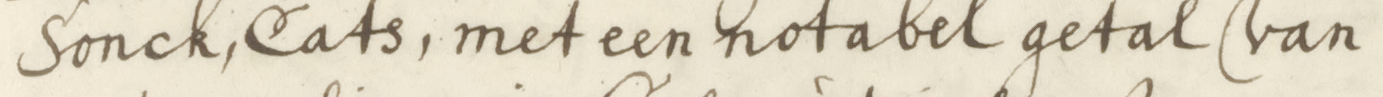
Sonck, Cats, met een notabel getal van
